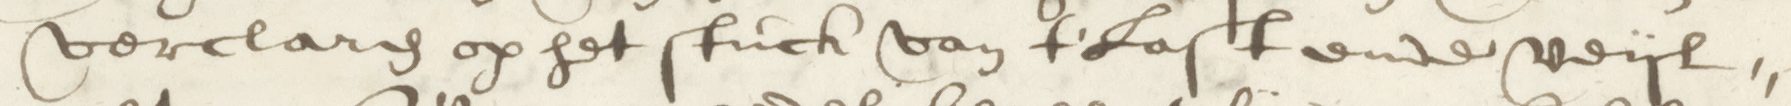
verclaren op het stuck van t' Last ende Veijl„
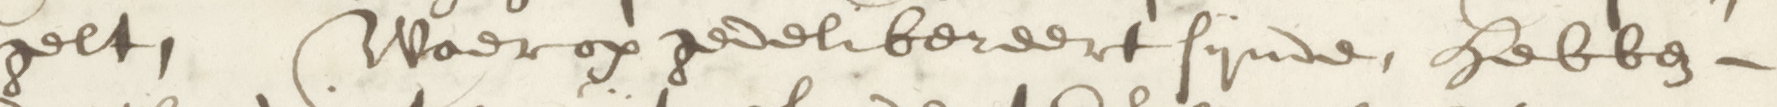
gelt. Waer op gedelibereert sijnde, hebben -
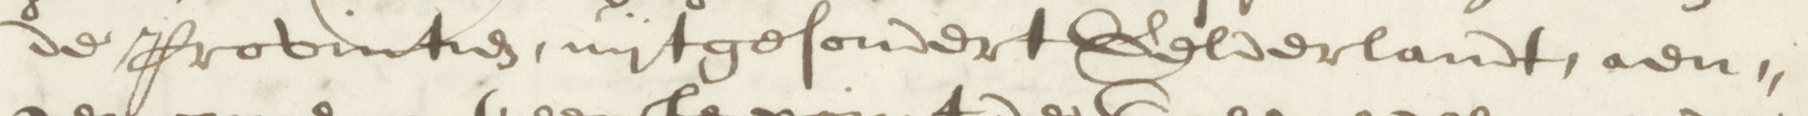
de Provintien, uijtsondert Gelderlandt, aen„
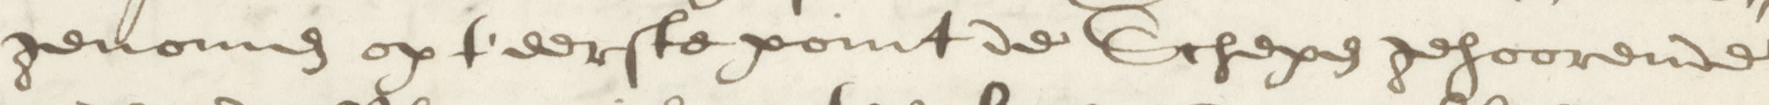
genomen op t'eerste point de Schepen gehoorende
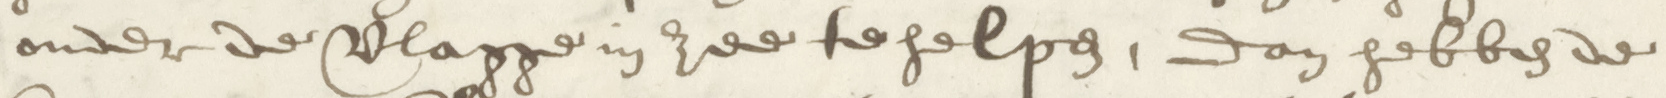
onder de vlagge in zee te helpen, dan hebben de
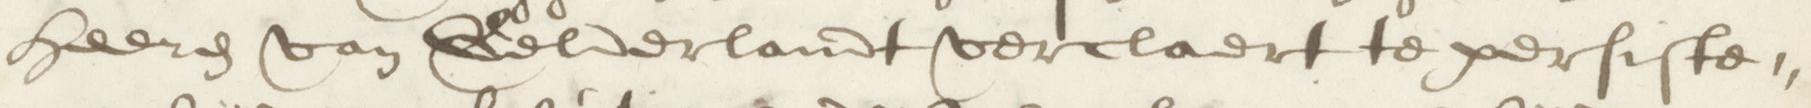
heeren van Gelderlandt verclaert te persiste„
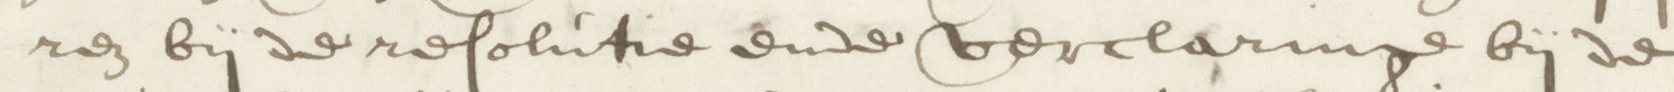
ren bij de resolutie ende verclaringe bij de
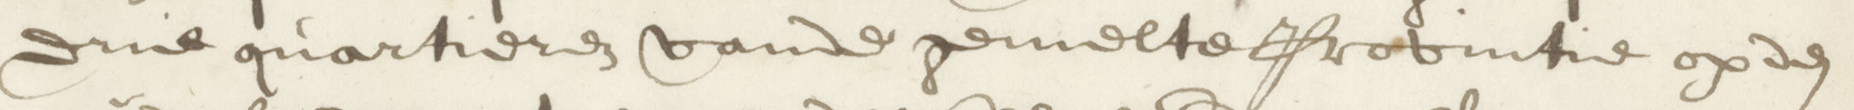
drie quartieren vande gemelte Provintie op den
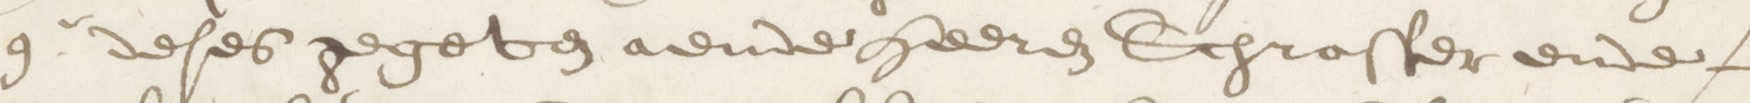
9e deses gegeven aende heeren Schrasser ende
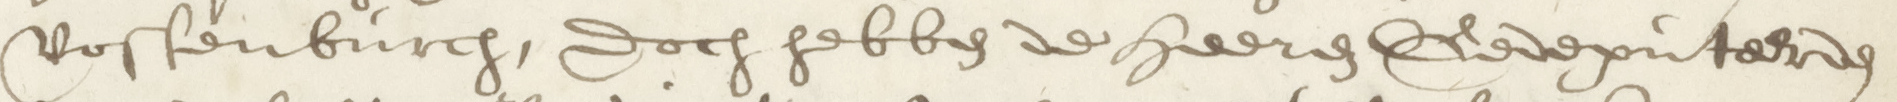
Vossenburch, doch hebben de heeren Gedeputeerden
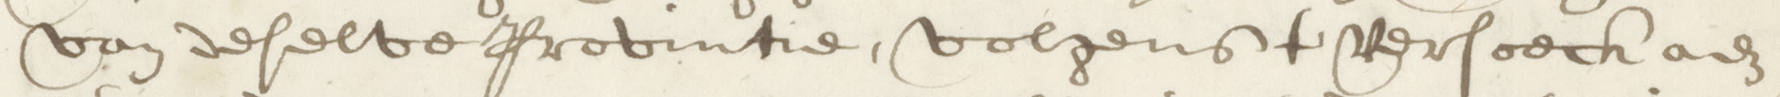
van deselve Provintie, volgens t'versoeck aen
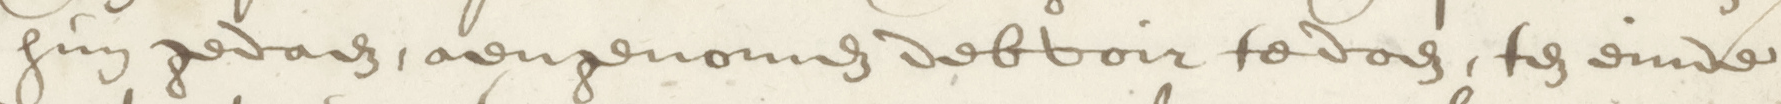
hun gedaen, aengenomen debvoir te doen, ten einde
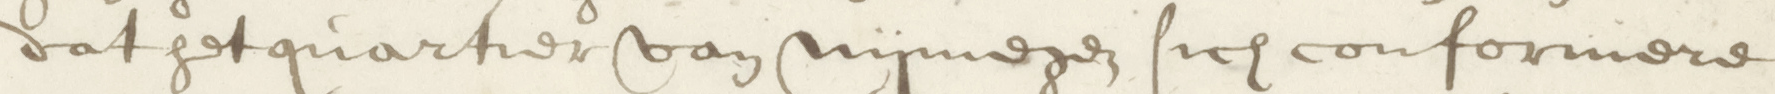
dat het quartier van Nijmegen sich conformere
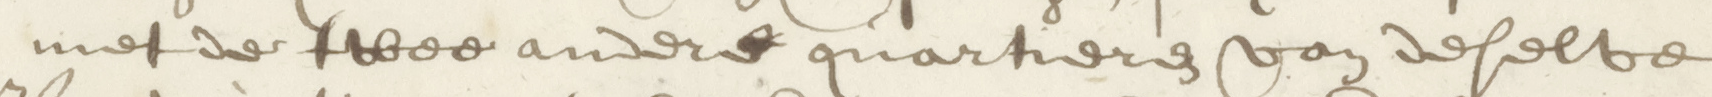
met de twee andere quartieren van deselve
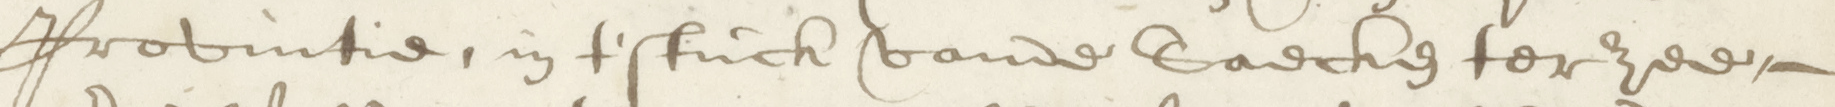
Provintie, in t'stuck vande Saecken ter zee,-
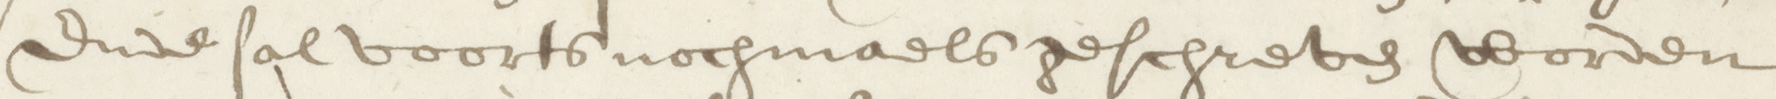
Ende sal voorts nochmaels geschreven worden
